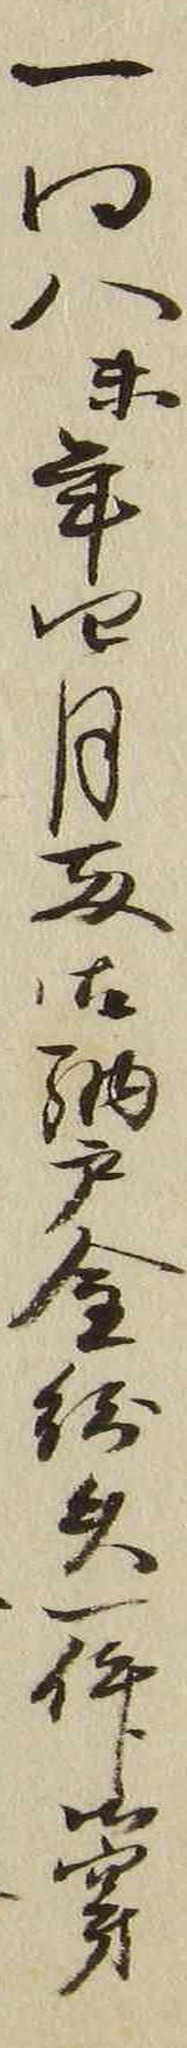一同八未年四月両御納戸金紛失一件御穿
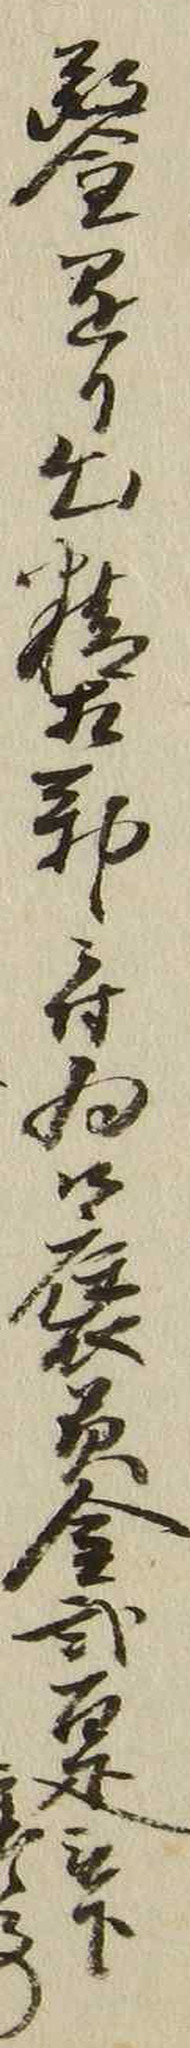鑿懸り出精相勤候ニ付為御褒美金弐百疋被下置候事
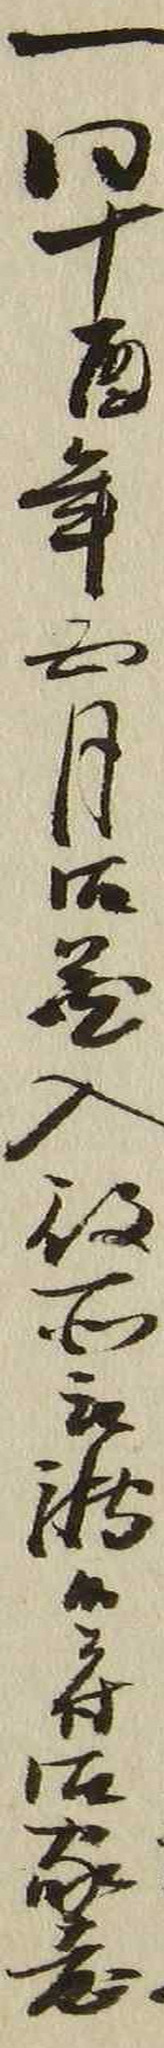一同十酉年五月御蔵入役所被転候ニ付御家老
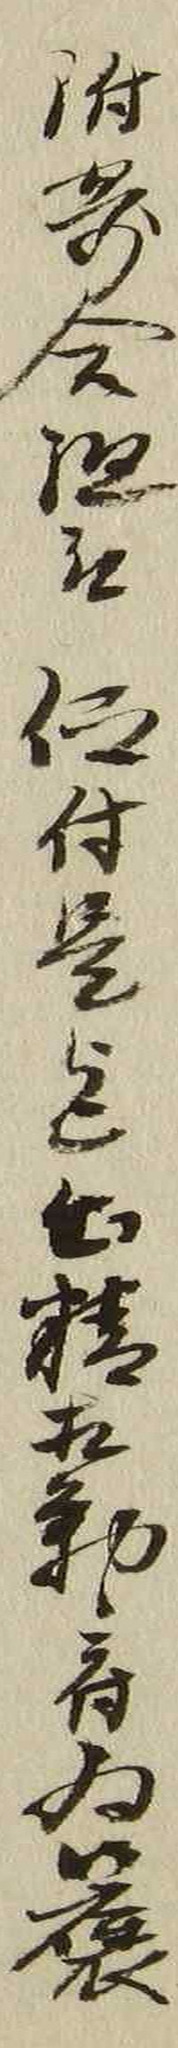附寄合組被仰付是迄出精相勤候ニ付為御褒
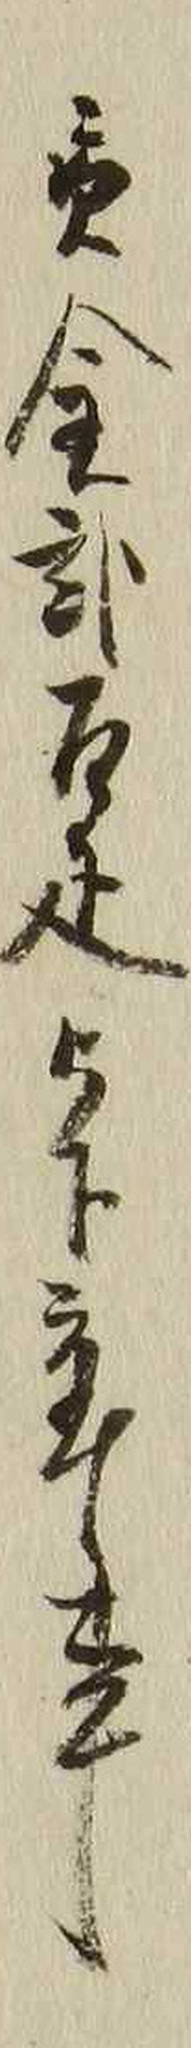美金弐百疋被下置候事
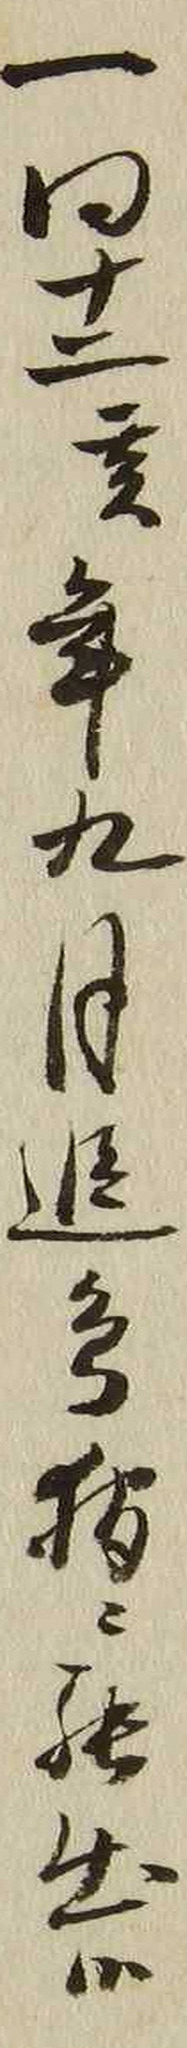一同十二亥年九月追鳥狩ニ罷出候
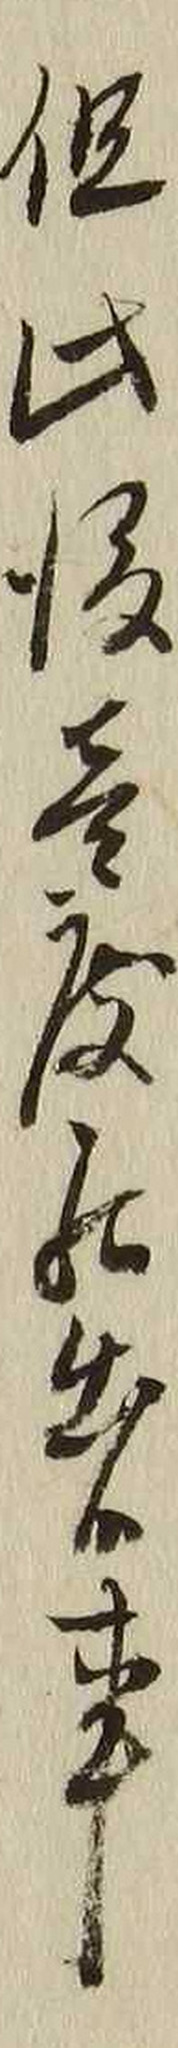但此後壱度罷出候事
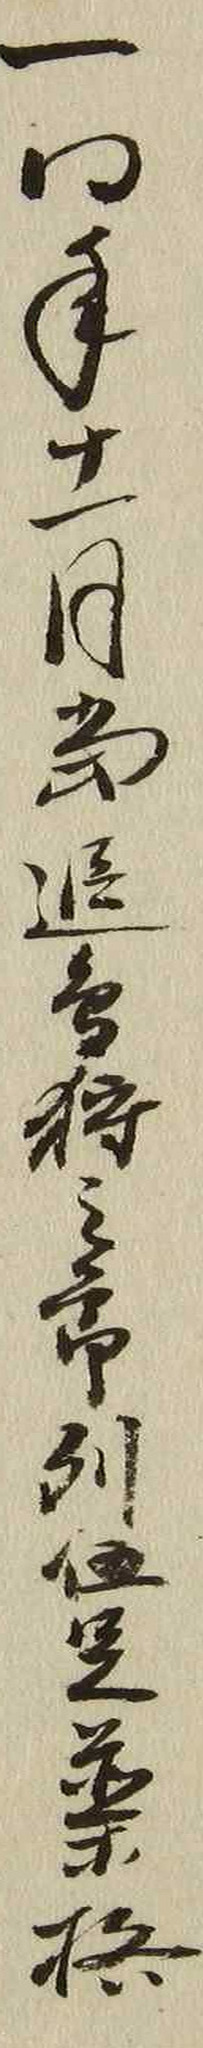一同年十一月当追鳥狩之節列伍足並等格
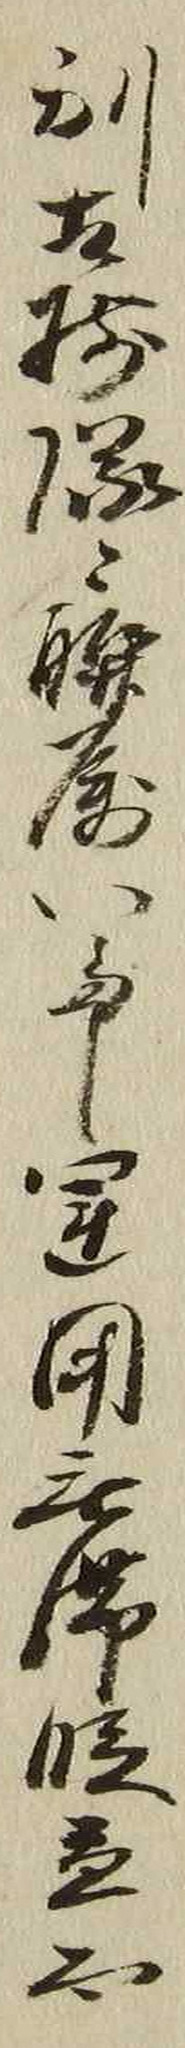別相揃隊々聯属いたし運用無滞段兼而
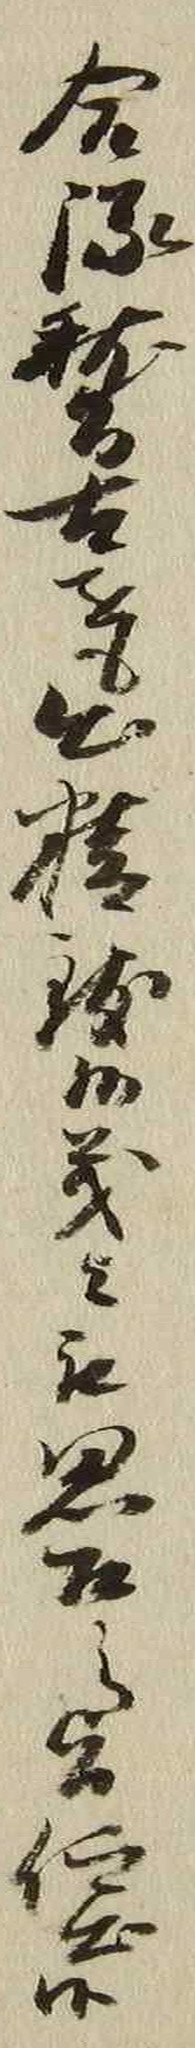合隊稽古をも出精致候義と被思召之旨仰出候
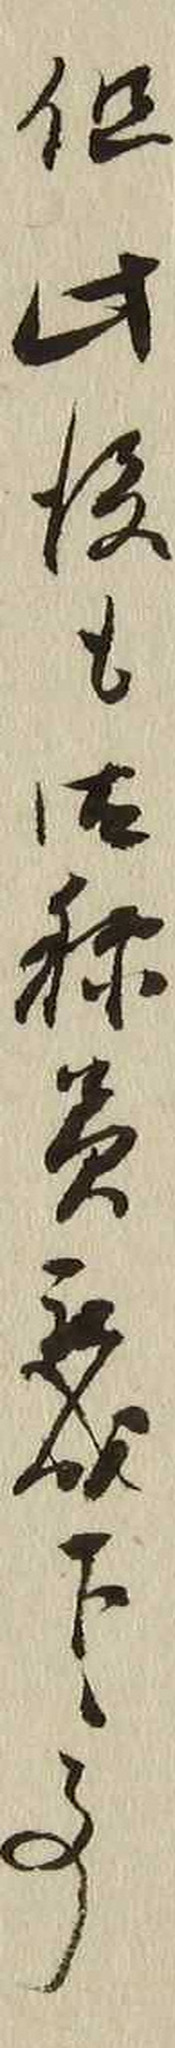但此後も御称美被成下候事
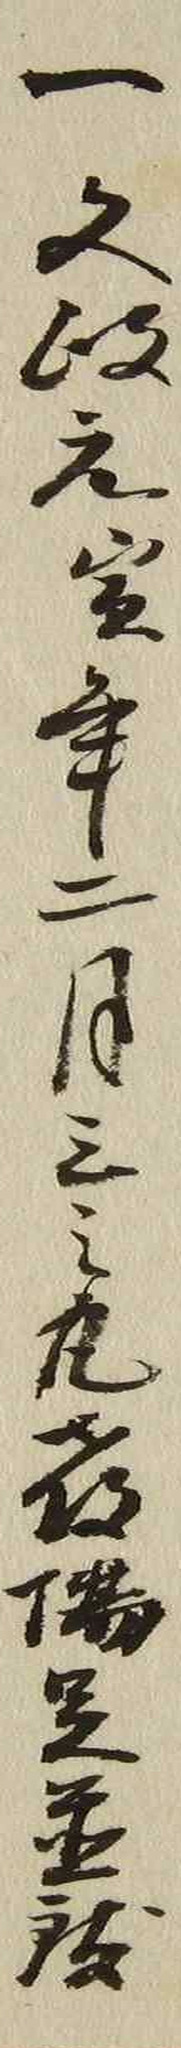一文政元寅年二月三之丸教場足並致
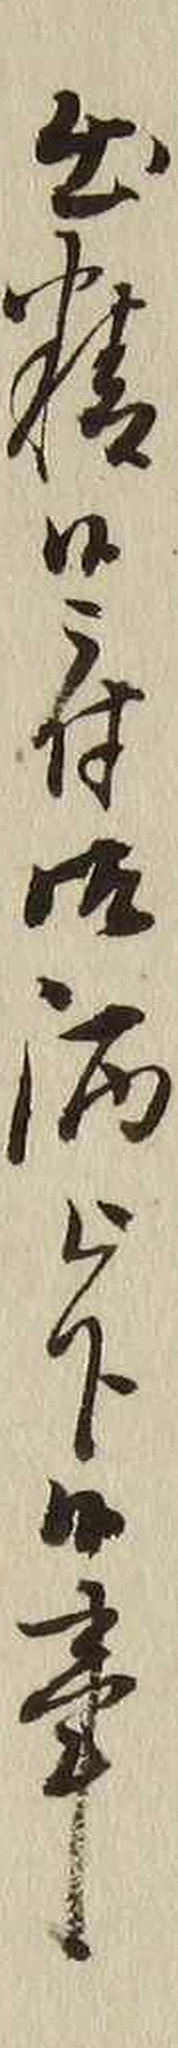出精候ニ付御酒被下候事
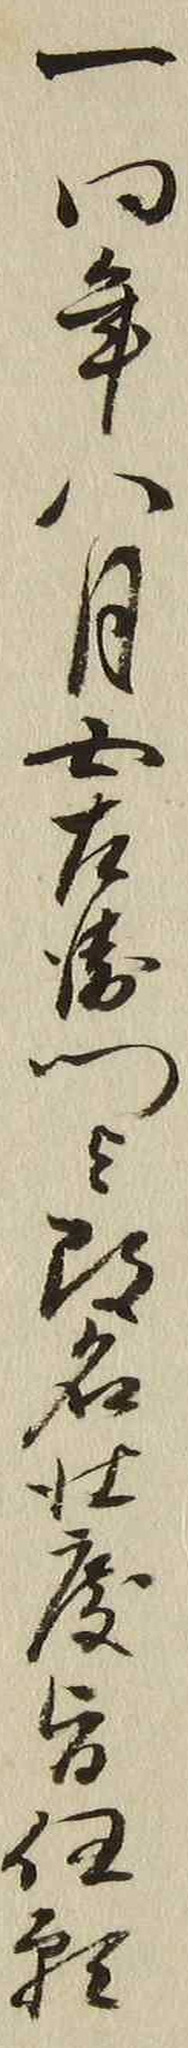一同年八月五左衛門と改名仕度旨任願

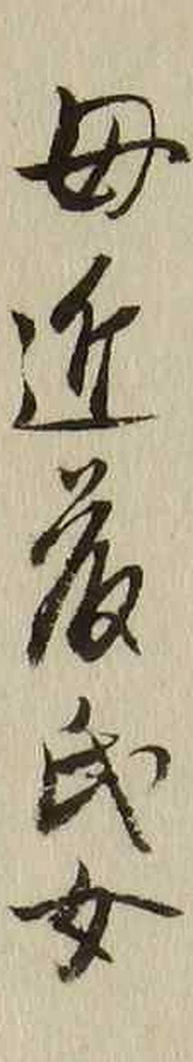母近藤氏女
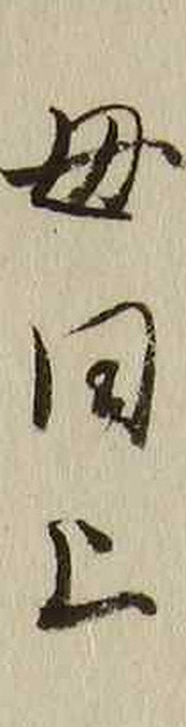母同上
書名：諸士系譜　巻之360　す之部10
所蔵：会津若松市立会津図書館
